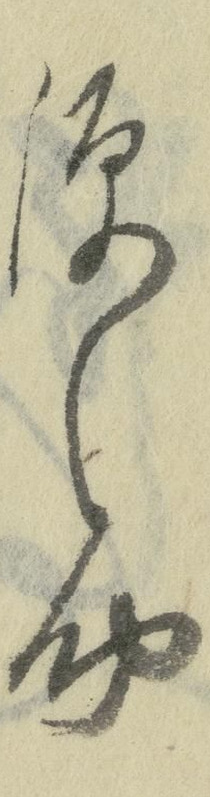宇之助

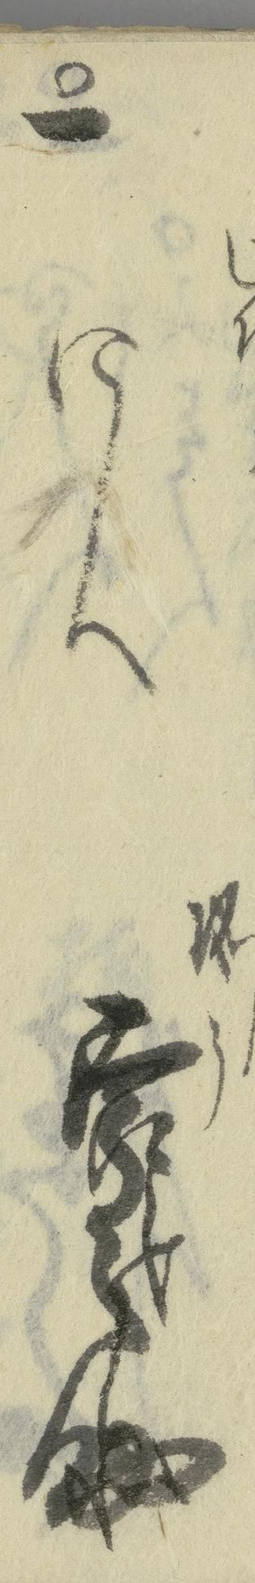○一四人かね
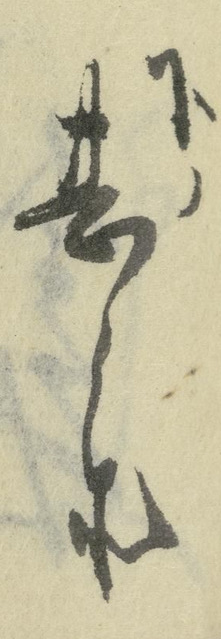甚兵衛
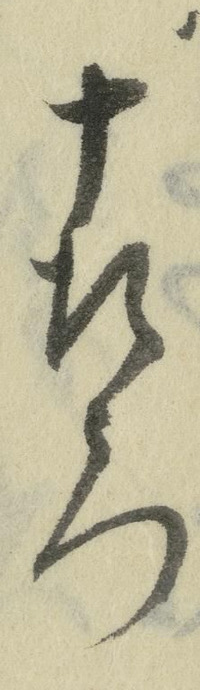十左衛門
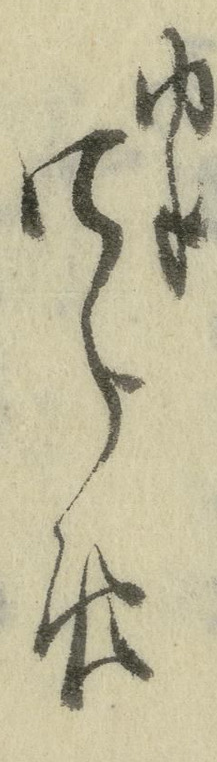四郎次

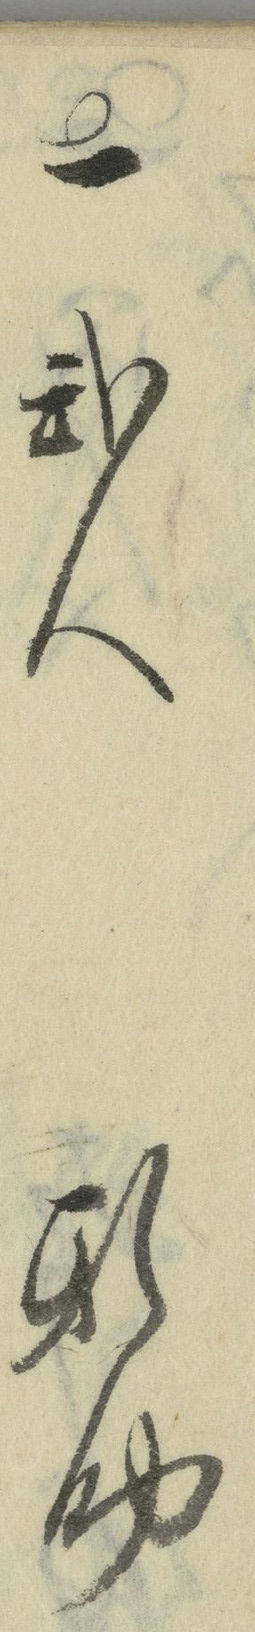○一弐人新助
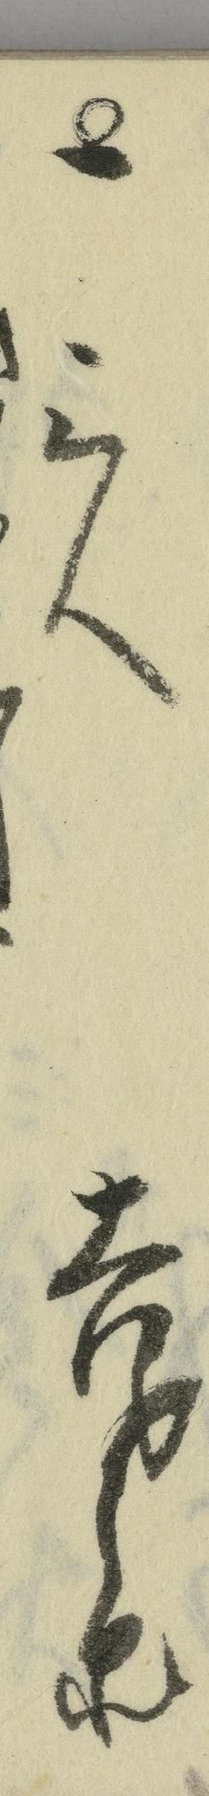○一三人吉兵衛

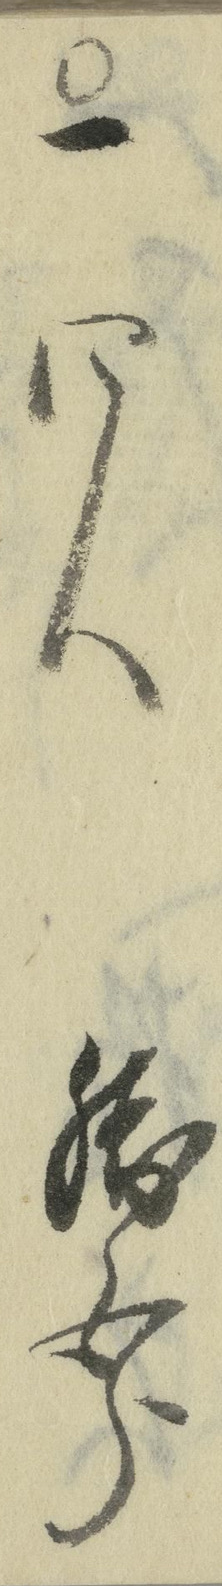○一四人勝五郎
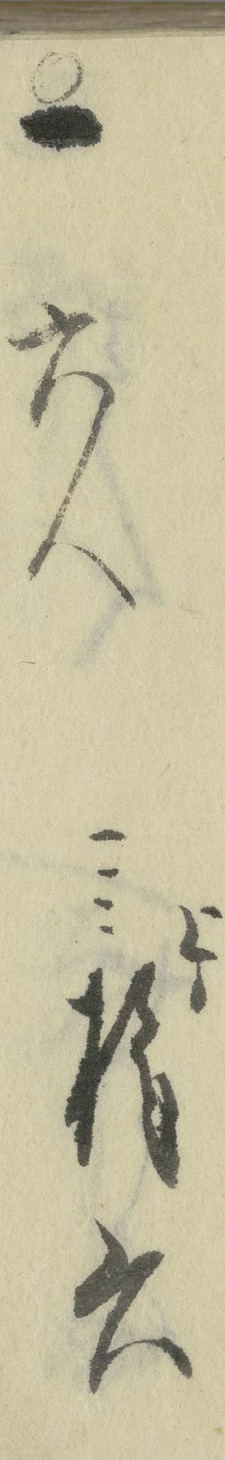○一六人庄七
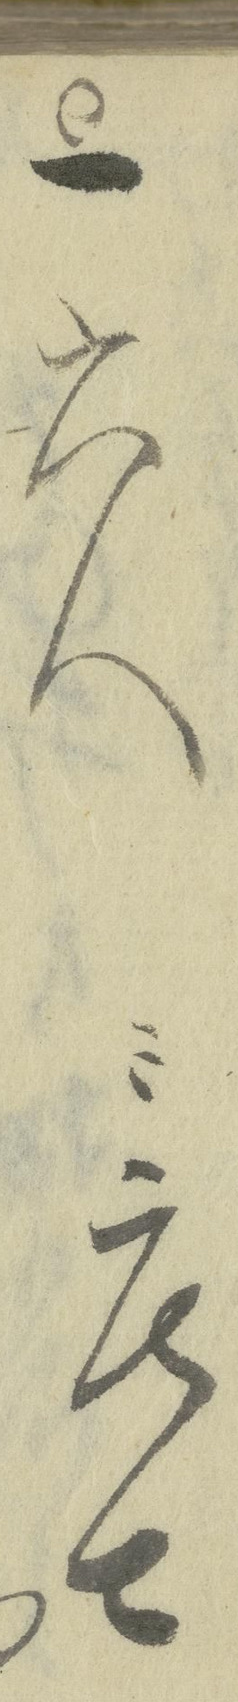○一六人庄七

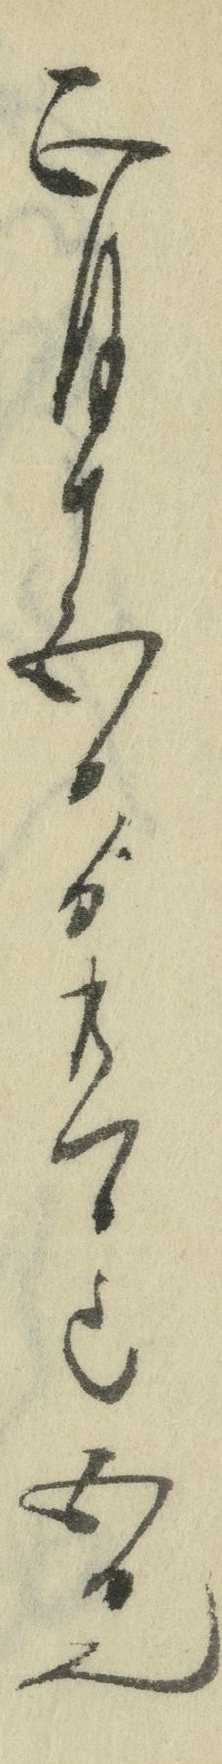正月十五日ゟ廿一日迄五日也
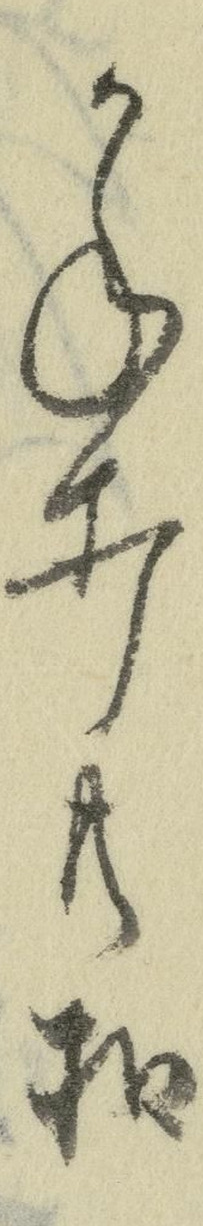かね打共扣
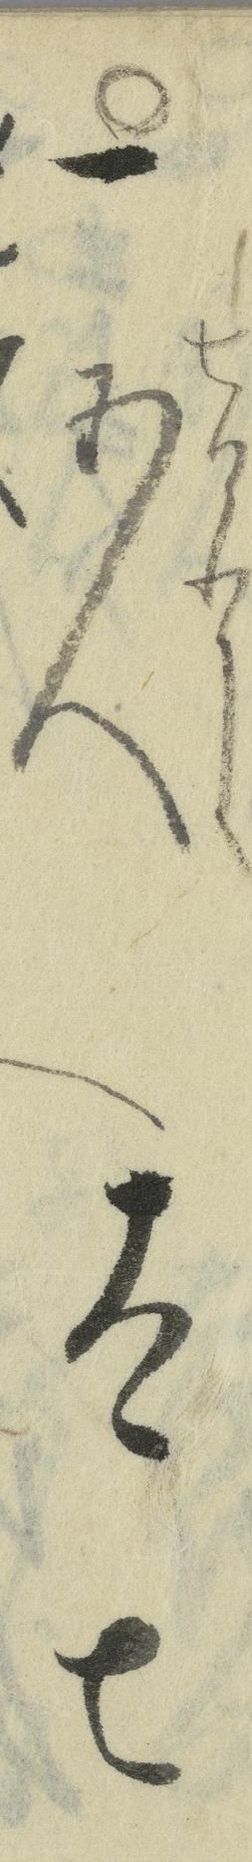○一五人太七
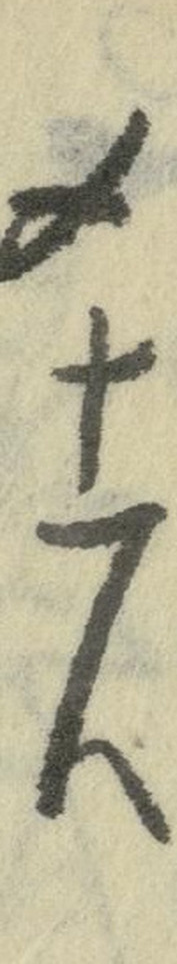〆十一人
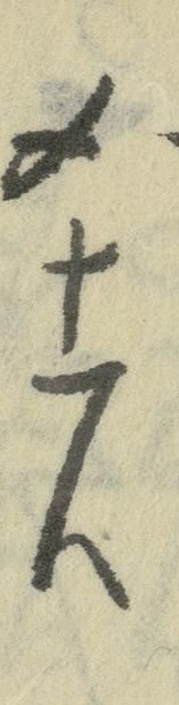〆十一人
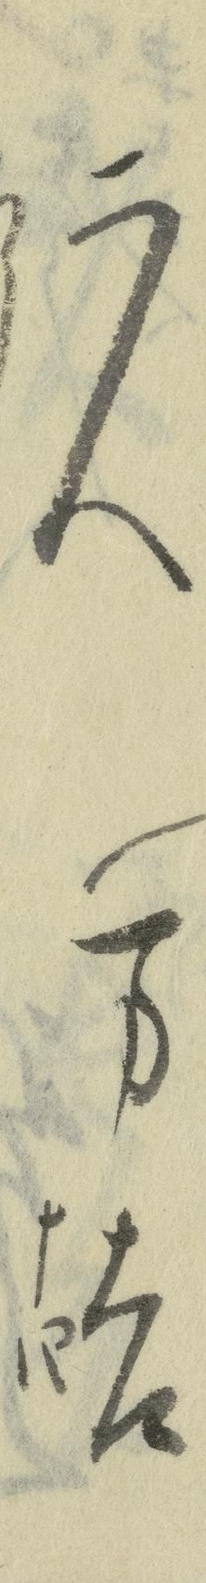二人万吉
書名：天明淺間噴火ニ関スル書類
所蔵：東京大学地震研究所図書室 Earthquake Research Institute Library, The University of Tokyo, JAPAN
